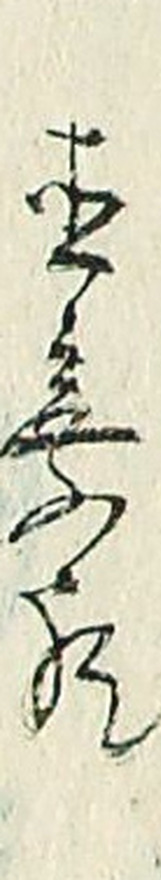直乗か
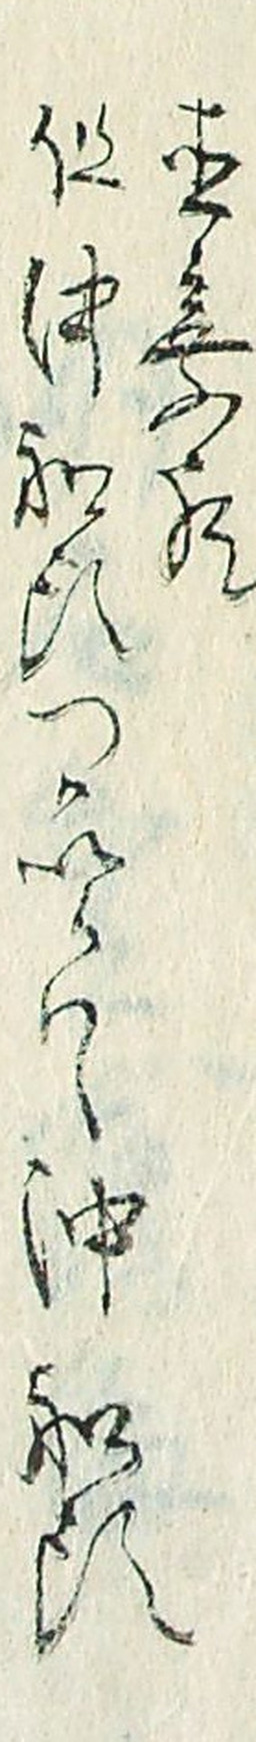但沖船頭つかい候はゝ沖船頭
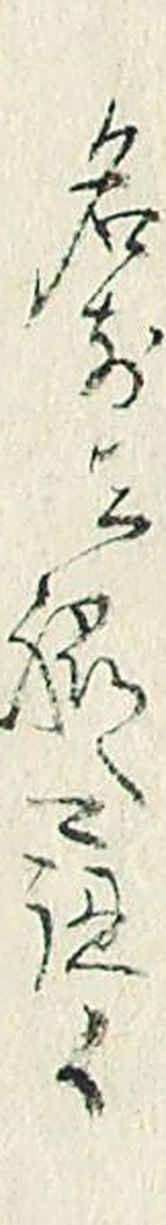名前を脇へ可認候

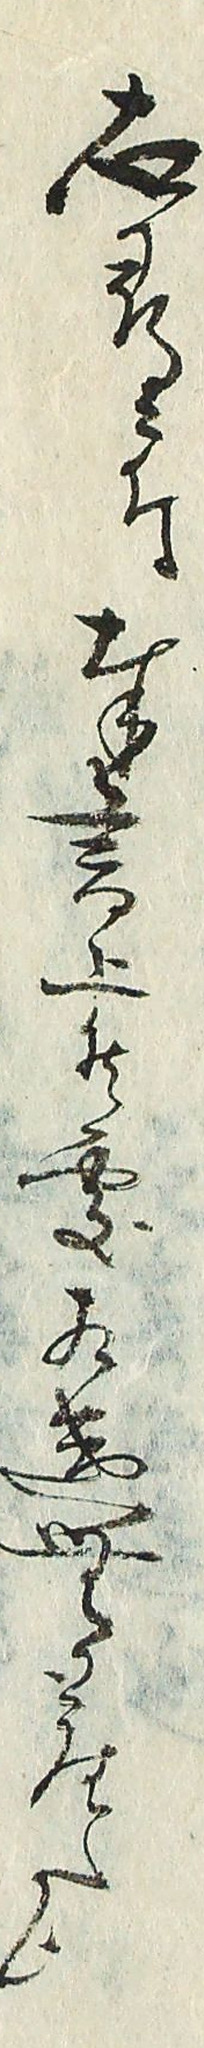右尋に付奉書上候処相違無御座候以上
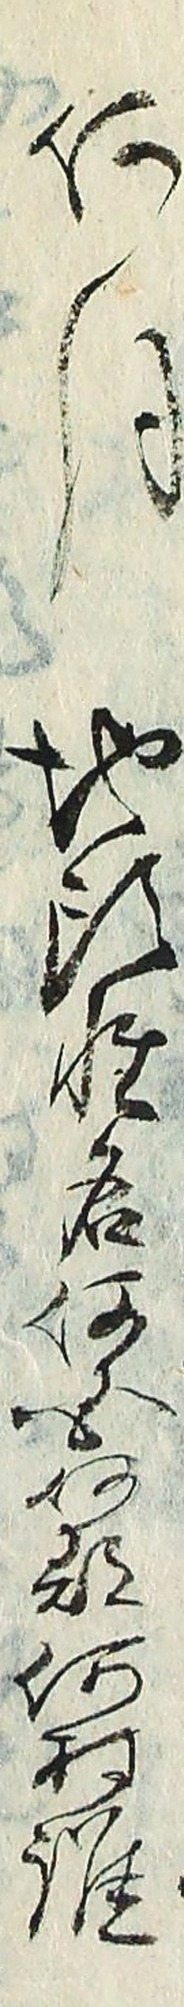何月地頭姓名何国何郡何村誰
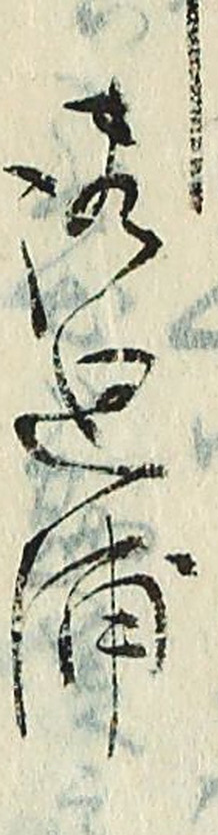御廻浦
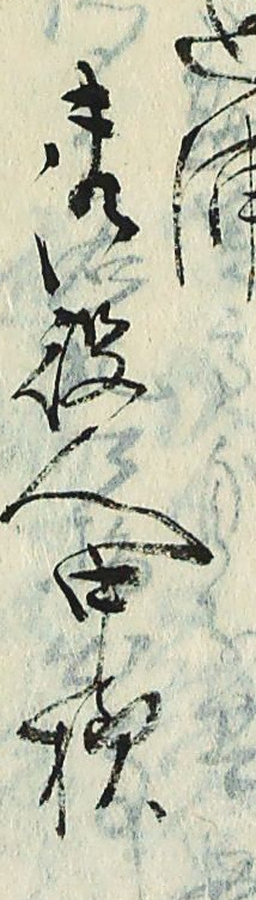御役人中様
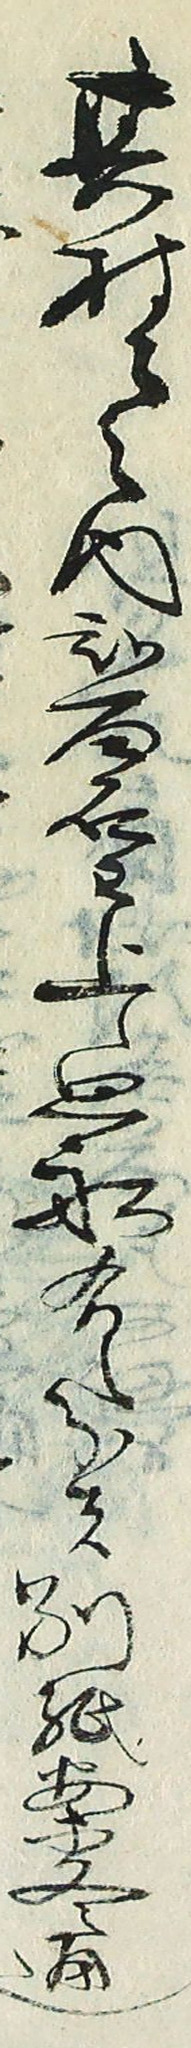其村々之内弐百石已上之廻船有之分は別紙案文之通
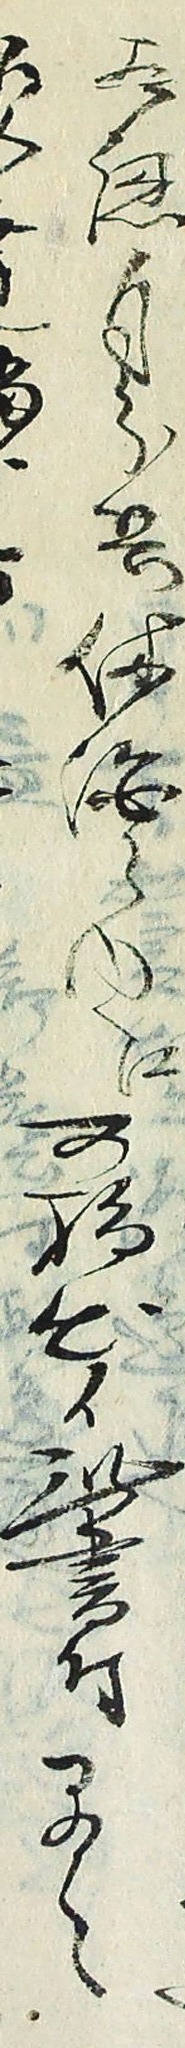相認自分共休泊之内え可指出候此書付早々
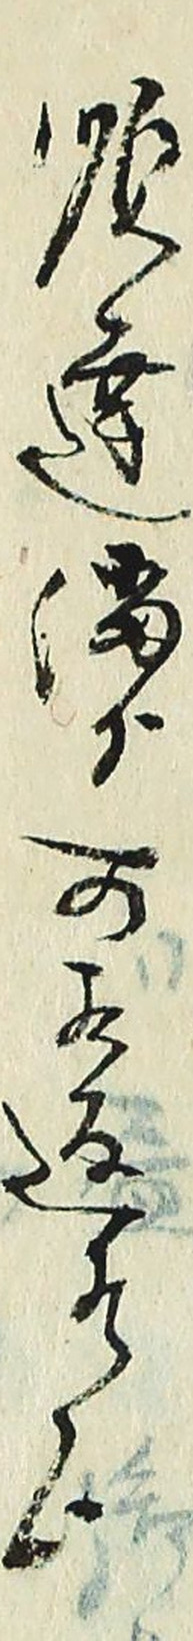順達済ゟ可相返候以上
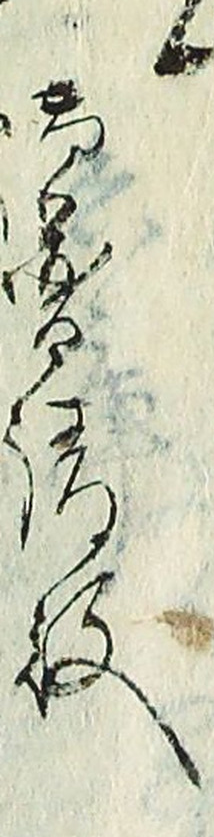御普請役
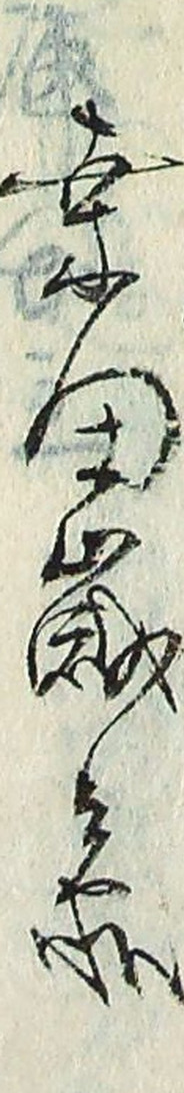桑田歳兵衛
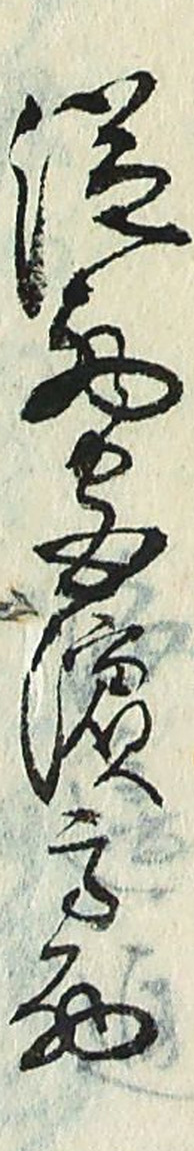従西宮浜方西
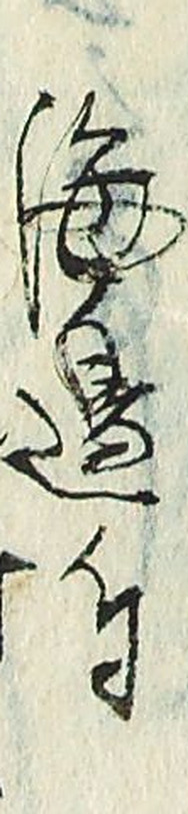海辺付
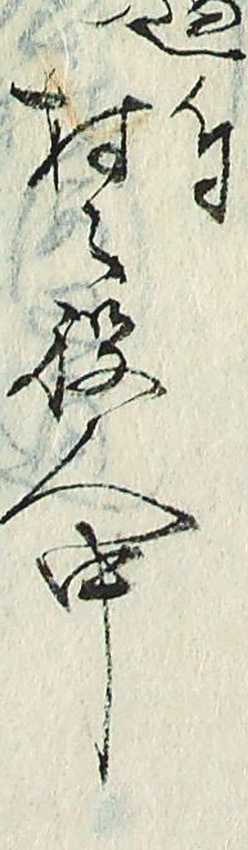村々役人中

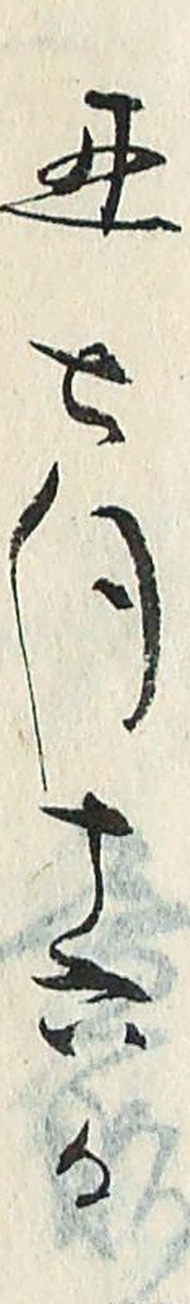丑七月十六日
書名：公辺御役人為御廻浦御立越諸御用一巻
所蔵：鳴門教育大学 Naruto University of Education
